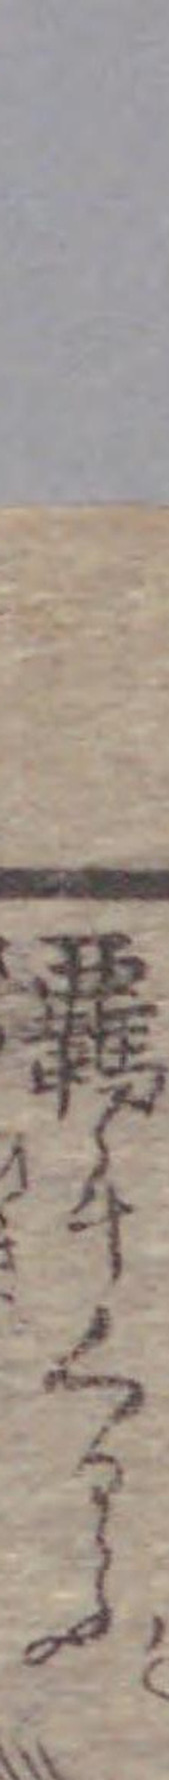羈にくるふ。
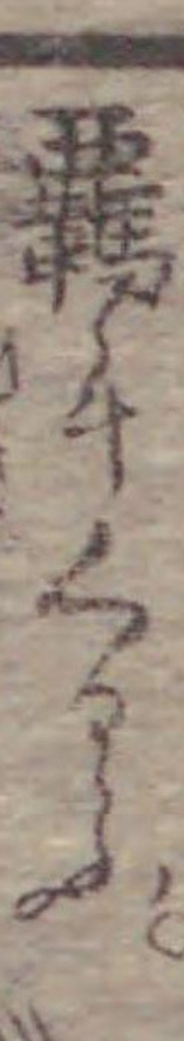羈にくるふ。
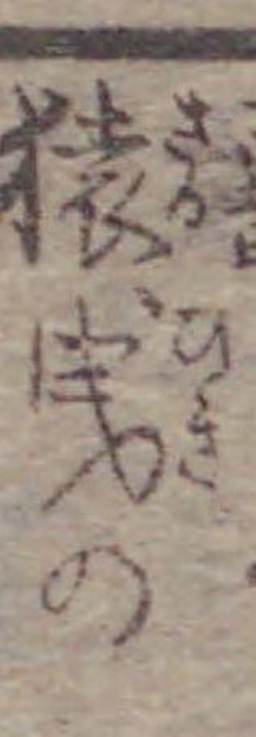猿曳の
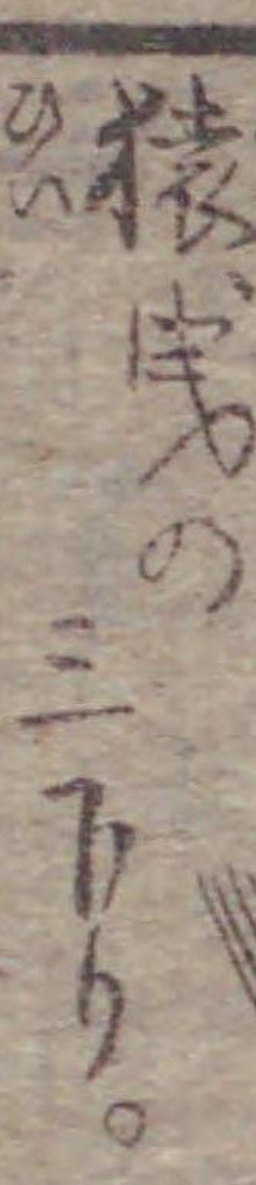三下り。
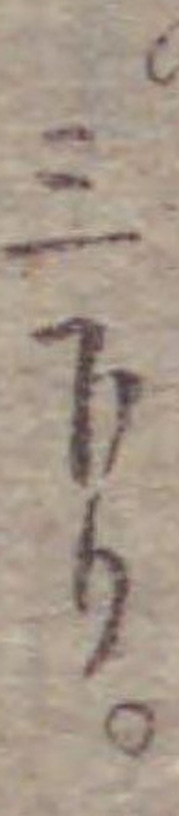三下り。
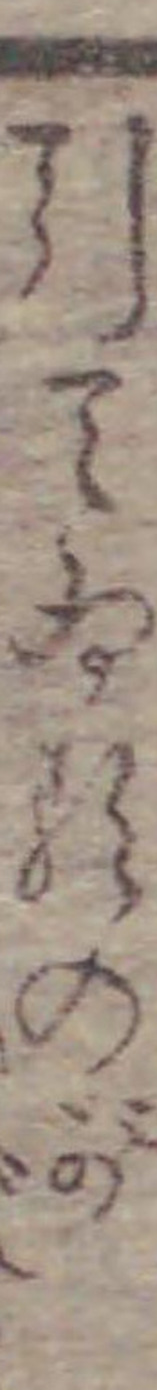引てゐるのが
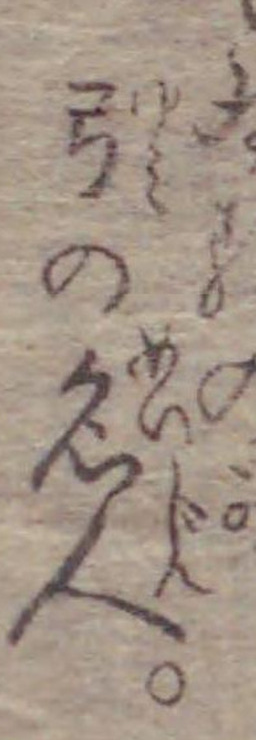弓の名人。

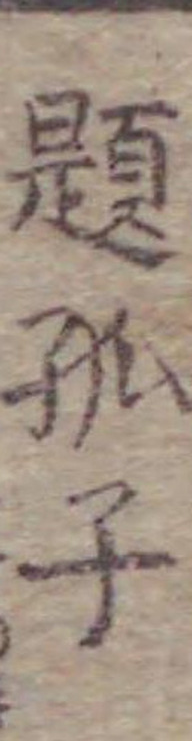題孤子
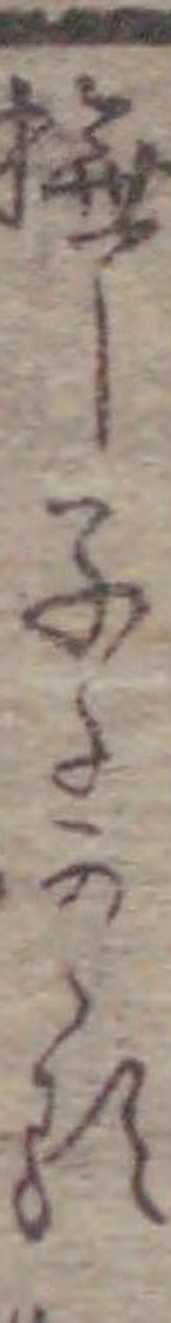撫し子にかゝる
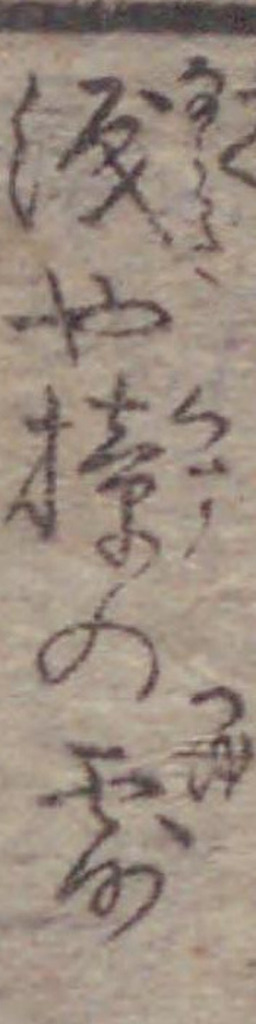涙や樟の露
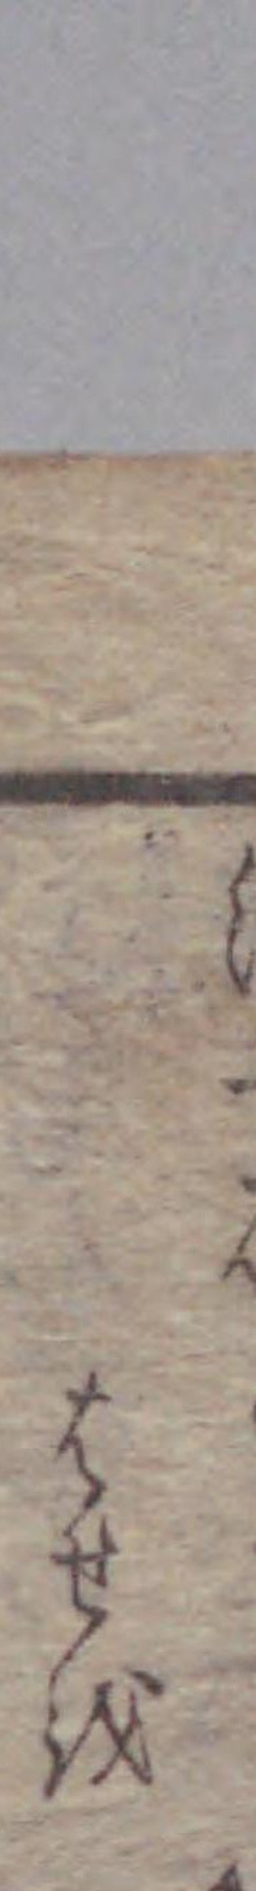はせを
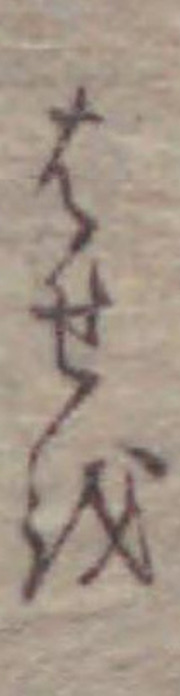はせを
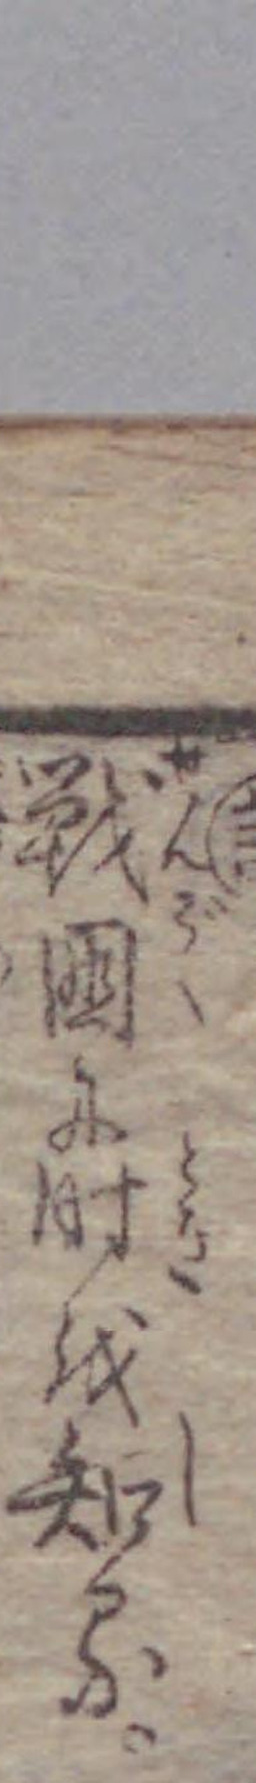戦国に時を知る。
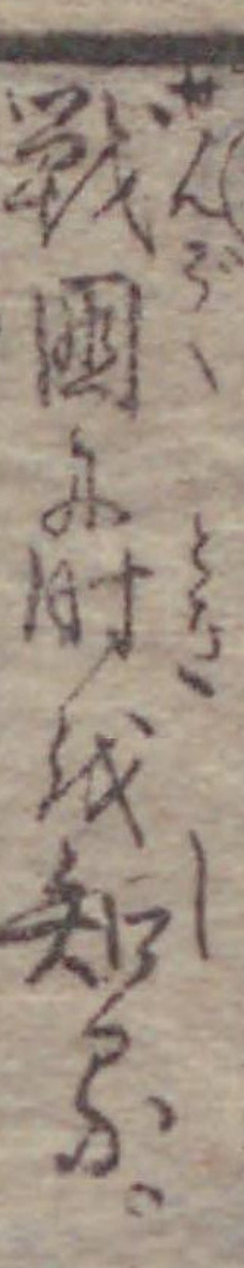戦国に時を知る。
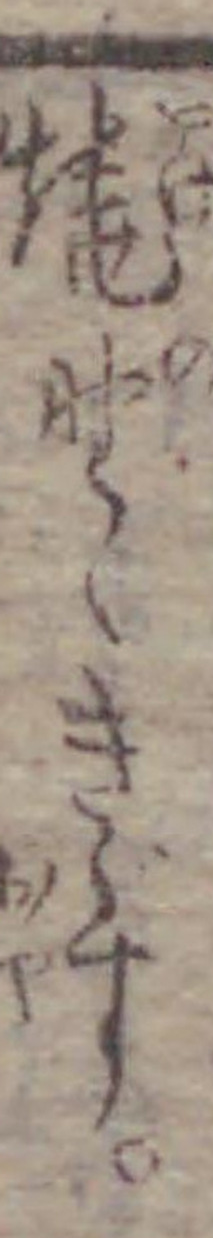焼野ゝきゞす。
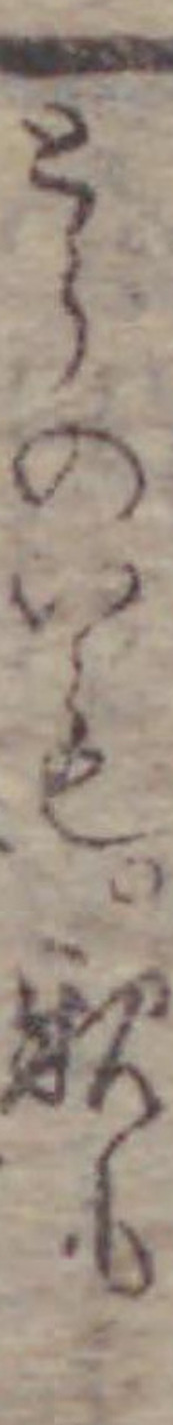とうのいも。親も
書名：武者合天狗俳諧 : 2巻
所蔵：国立国会図書館 National Diet Library, JAPAN
